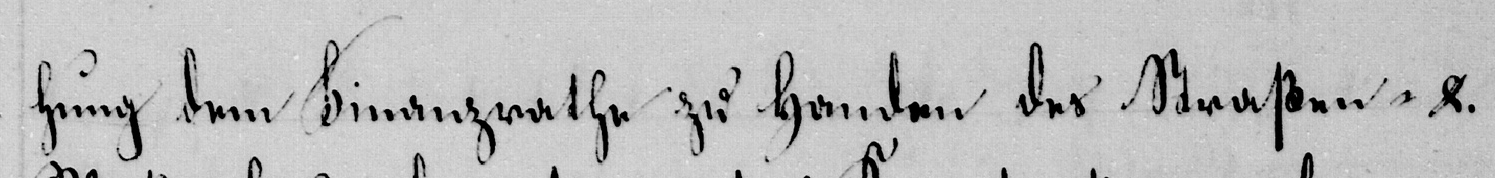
hung dem Finanzrathe zu Handen des Straßen- &.
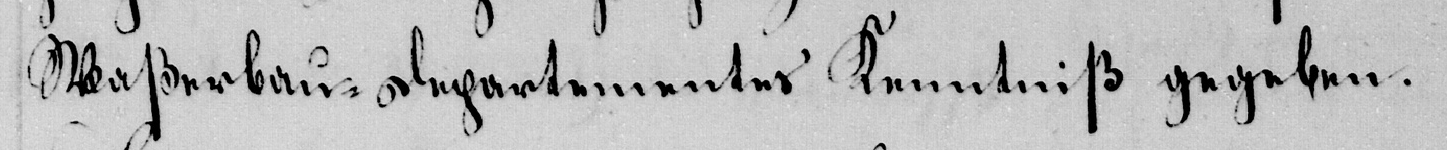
Waßerbau-Departementes Kenntniß gegeben.
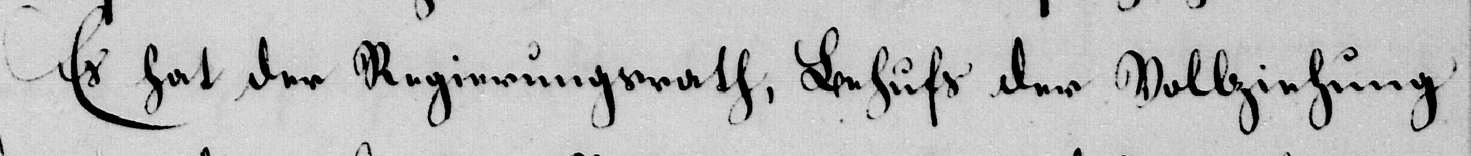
Es hat der Regierungsrath, Behufs der Vollziehung
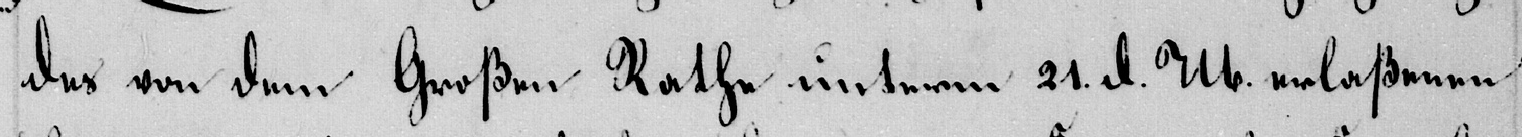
des von dem Großen Rathe unterm 21. d. M. erlaßenen
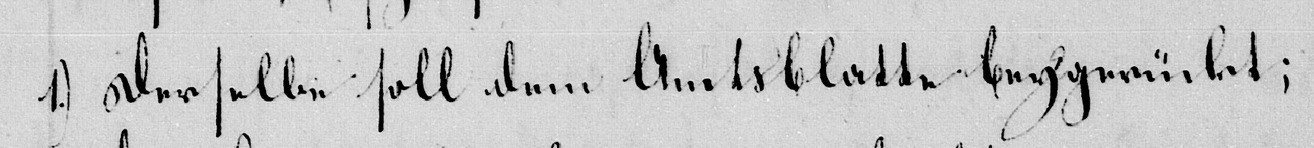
1.) Derselbe soll dem Amtsblatte beygerückt;
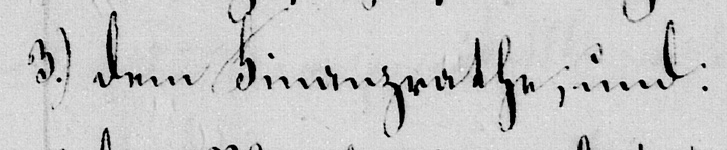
3.) dem Finanzrathe, und:
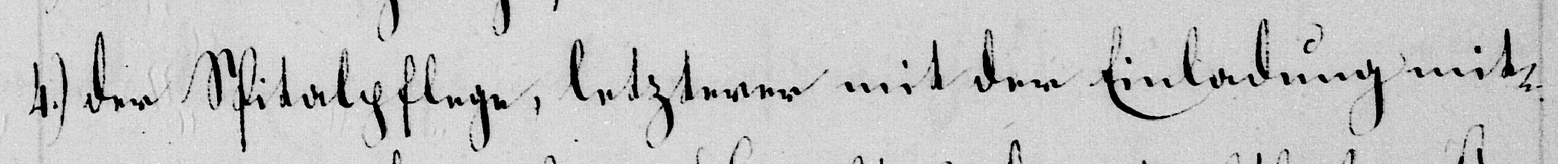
4.) der Spitalpflege, letzterer mit der Einladung mit¬
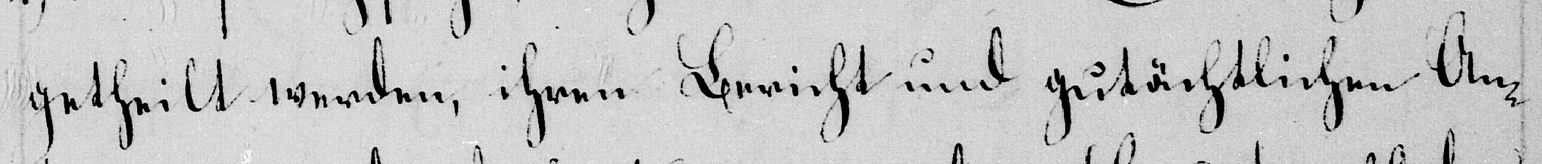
getheilt werden, ihren Bericht und gutächtlichen An¬
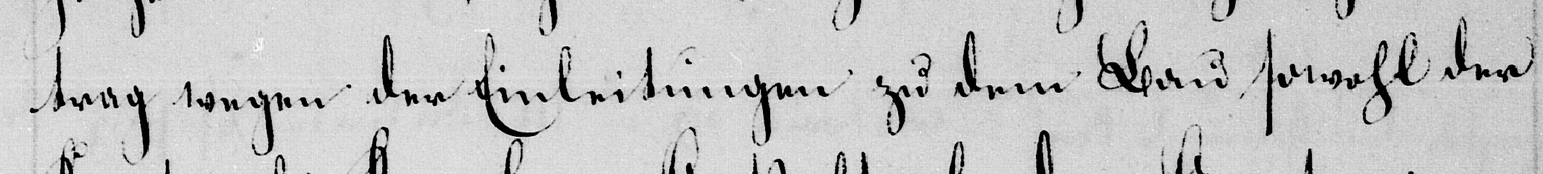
trag wegen der Einleitungen zu dem Bau sowohl der
